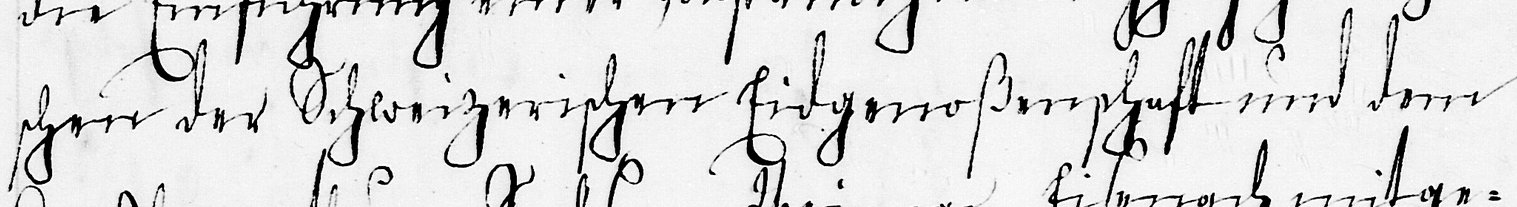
schen der Schweizerischen Eidgenoßenschaft und dem
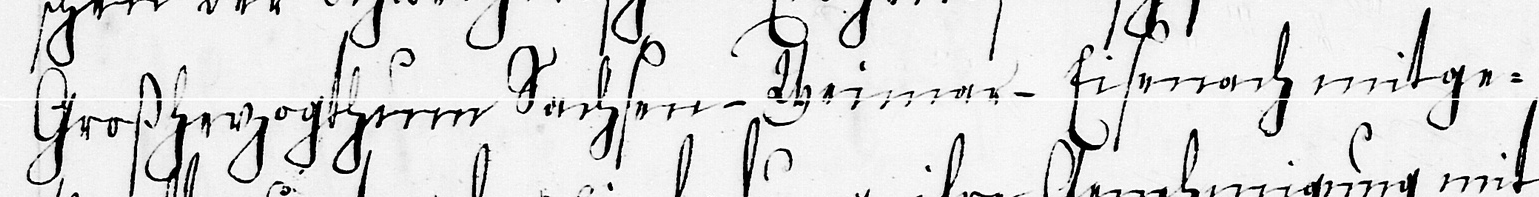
Großherzogthum Sachsen-Weimar-Eisenach mitge¬
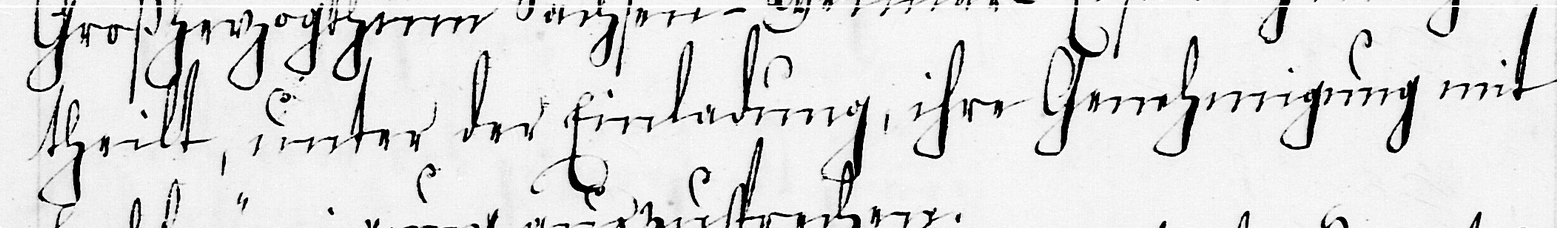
theilt, unter der Einladung, ihre Genehmigung mit
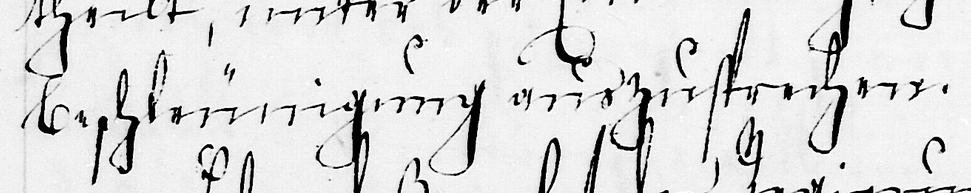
Beschleunigung auszusprechen.
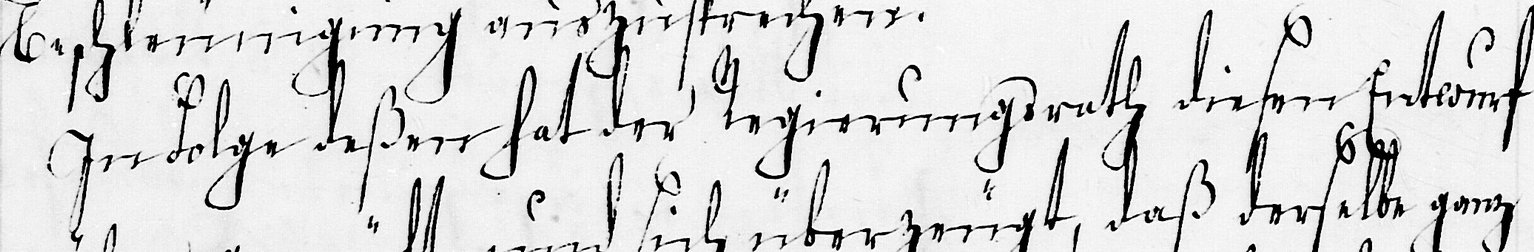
In Folge deßen hat der Regierungsrath diesen Entwurf
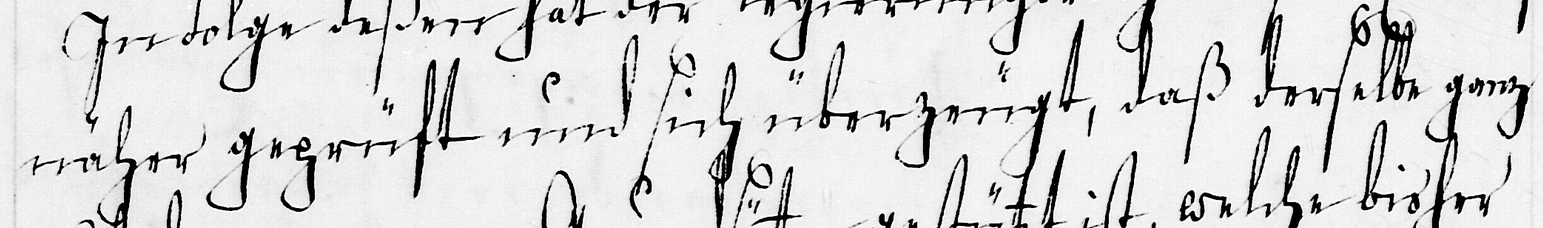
näher geprüft und sich überzeugt, daß derselbe ganz
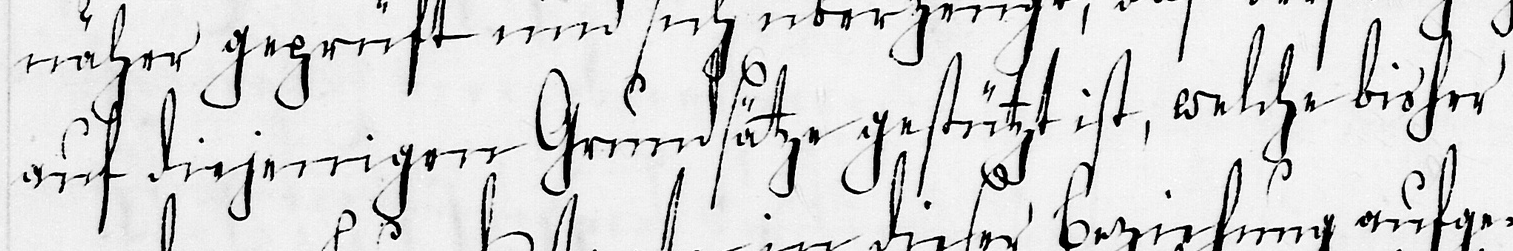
auf diejenigen Grundsätze gestützt ist, welche
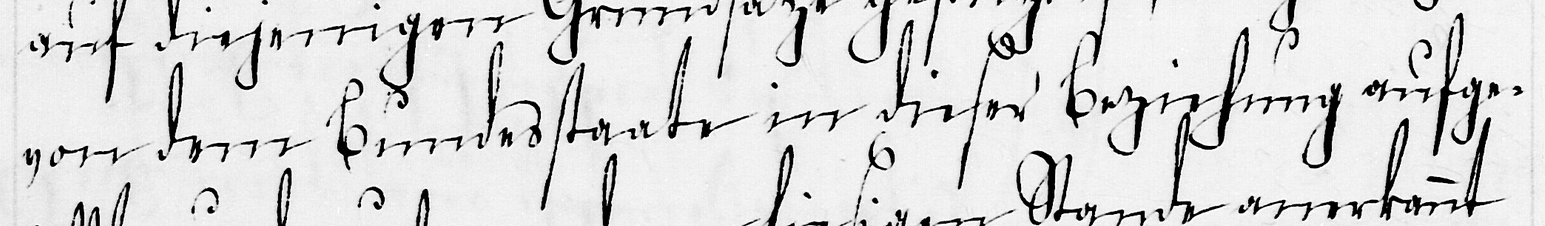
von dem Bundesstaate in dieser Beziehung aufge¬
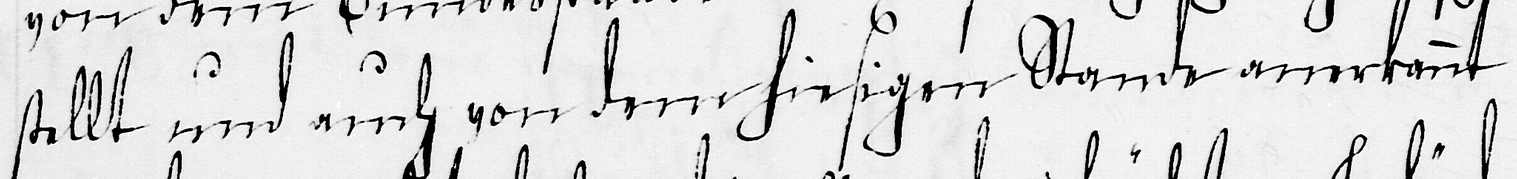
stellt und auch von dem hiesigen Stande anerkannt
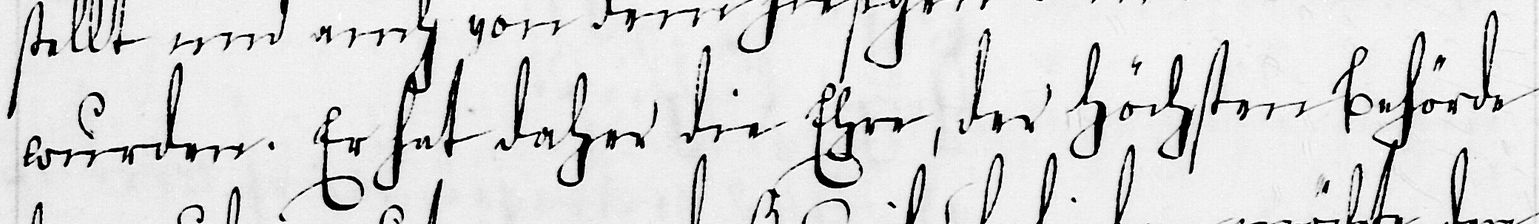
wurden. Er hat daher die Ehre, der Höchsten Behörde
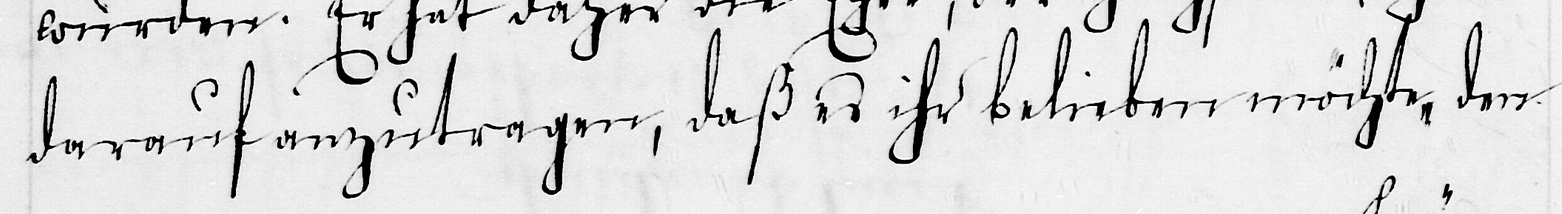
darauf anzutragen, daß es ihr belieben möchte, den
